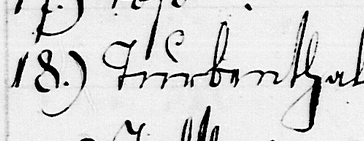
18.) Turbenthal
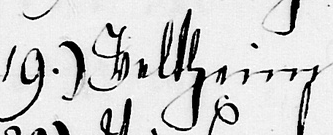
19.) Veltheim
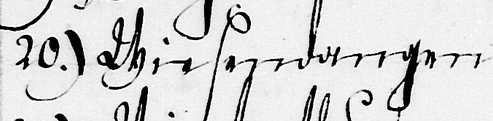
20.) Wiesendangen
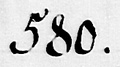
580.
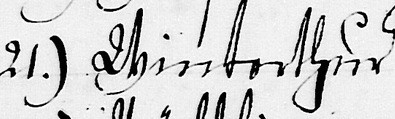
21.) Winterthur
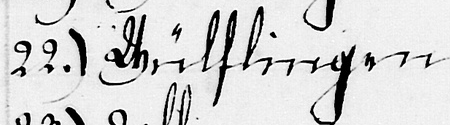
22.) Wülfingen
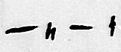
27.
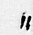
44.
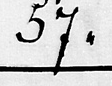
37.
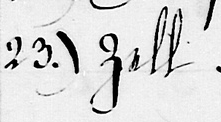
23.) Zell
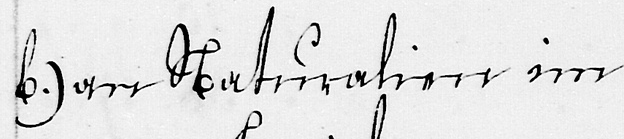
b.) an Naturalien im
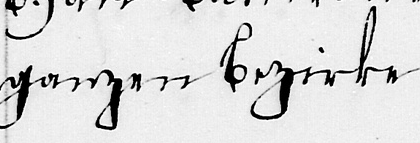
ganzen Bezirke
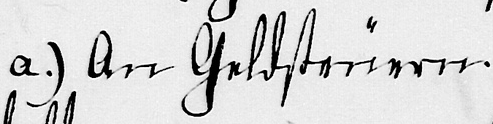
a.) An Geldsteuern.
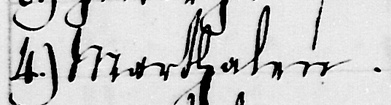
4.) Marthalen
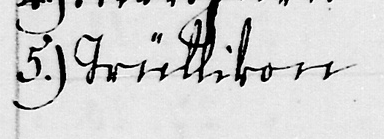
5.) Trüllikon
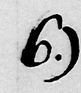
6.
